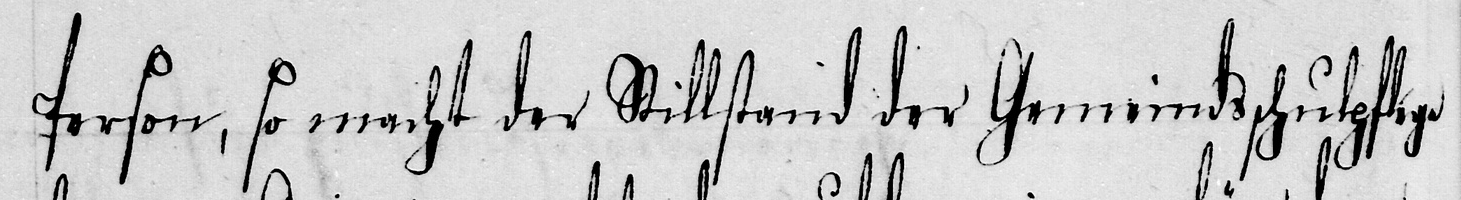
Person, so macht der Stillstand der Gemeindsschulp¬
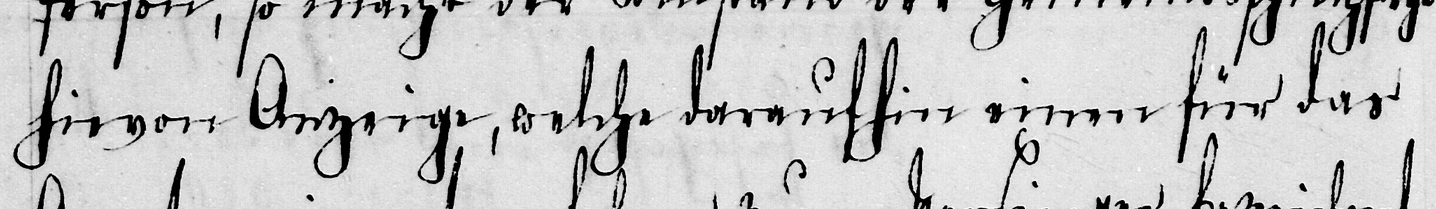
hievon Anzeige, welche daraufhin einen für das
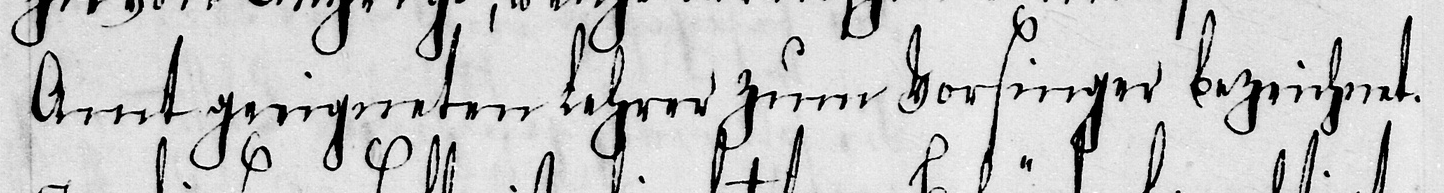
Amt geeigneten Lehrer zum Vorsinger bezeichnet.
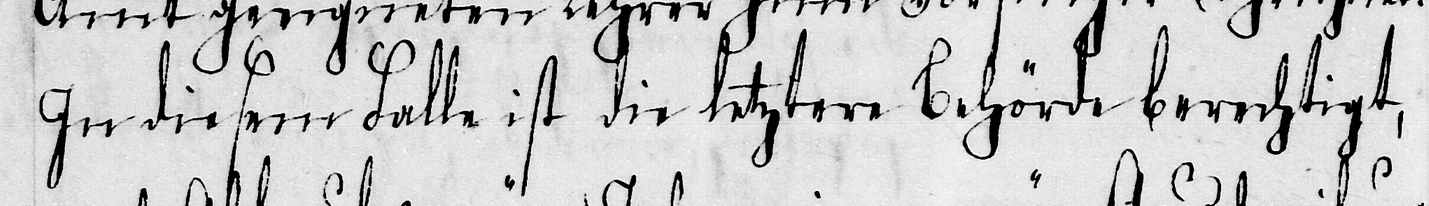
In diesem Falle ist die letztere Behörde berechtigt,
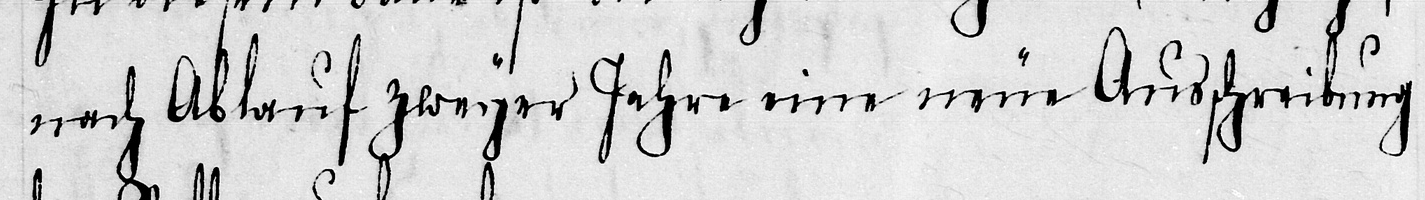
nach Ablauf zweyer Jahre eine neue Ausschreibung
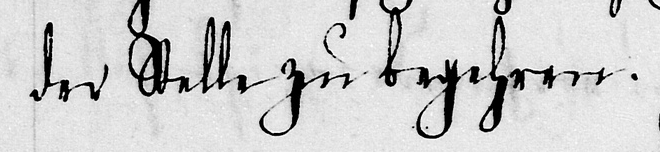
der Stelle zu begehren.
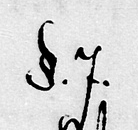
§. 7.
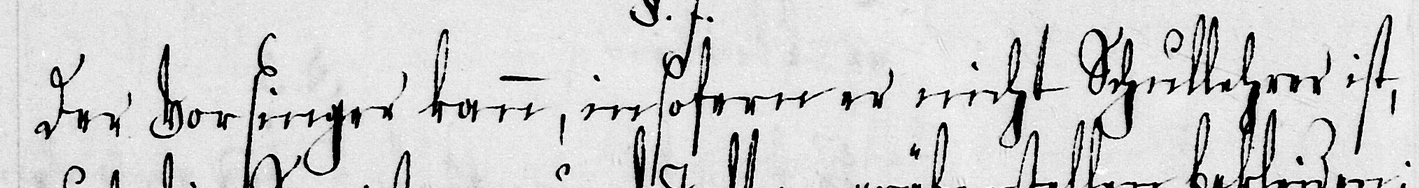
Der Vorsinger kann, insofern er nicht Schullehrer ist,
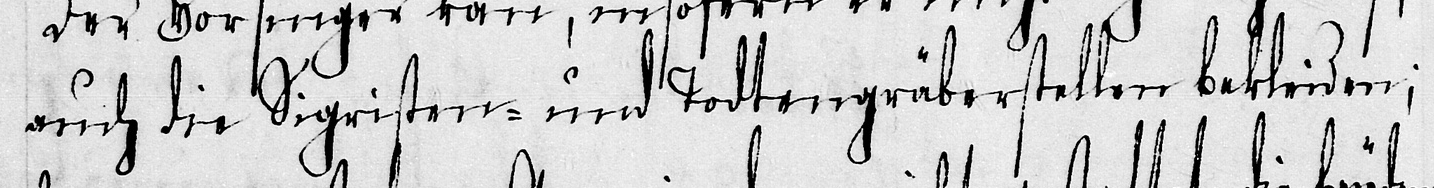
auch die Sigristen- und Todtengräberstellen bekleiden;
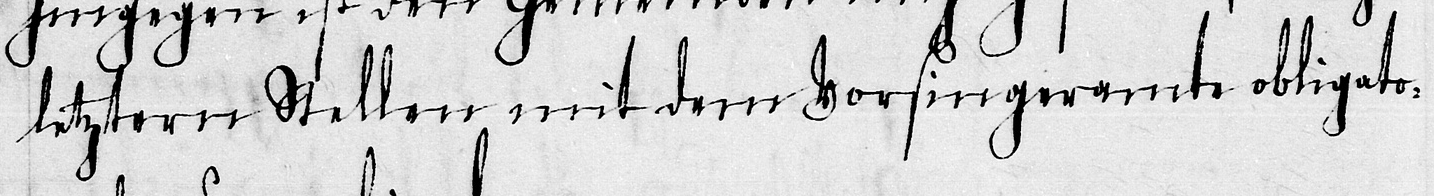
letztern Stellen mit dem Vorsingeramte obligat¬
